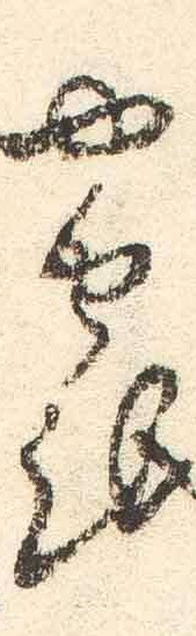やせを
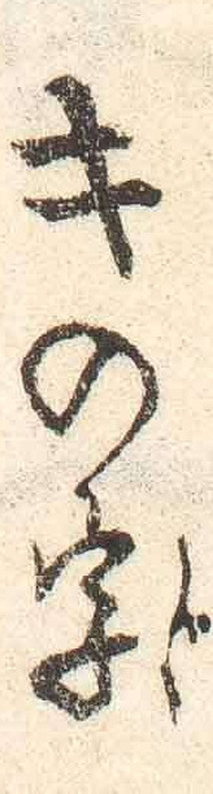キの字
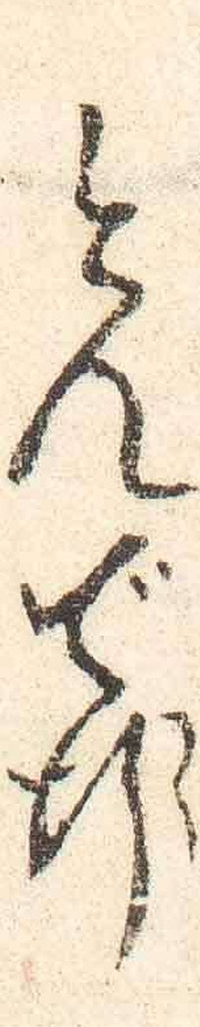とんで行
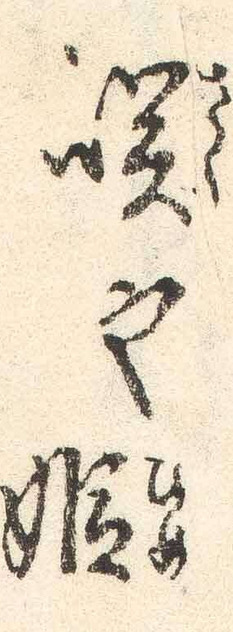咲や姫
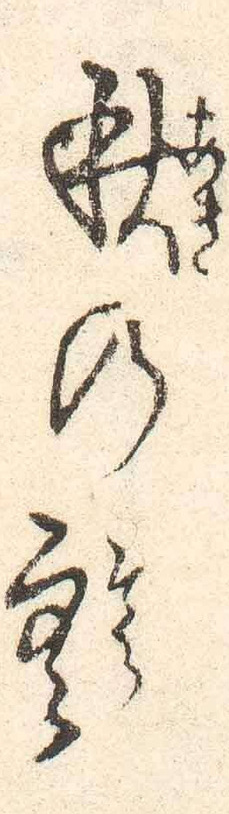秋の空
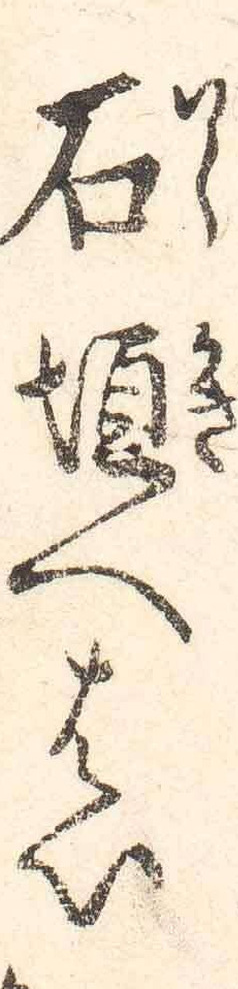石垣へはい
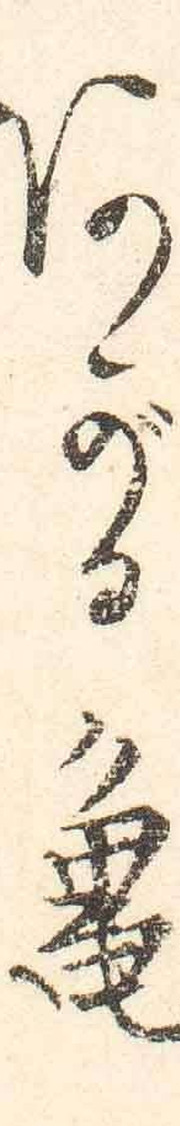あがる亀
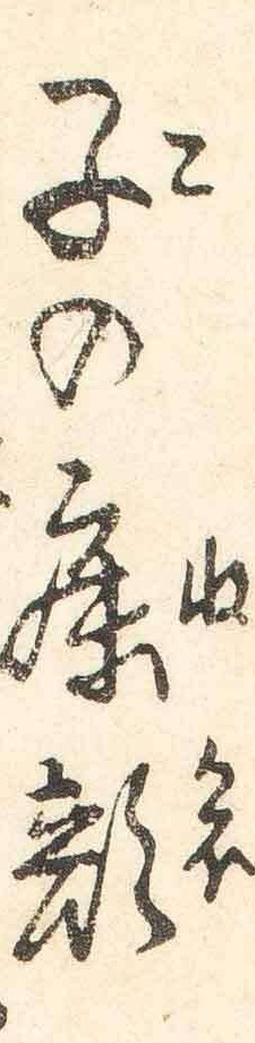子の寝顔
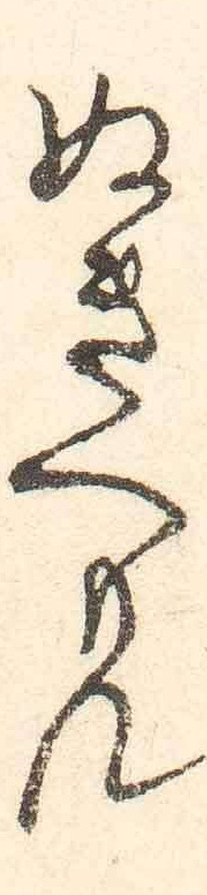ぬきへもん
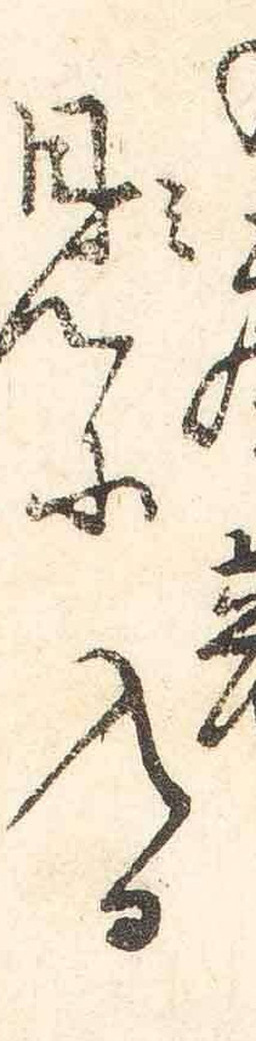見に入る
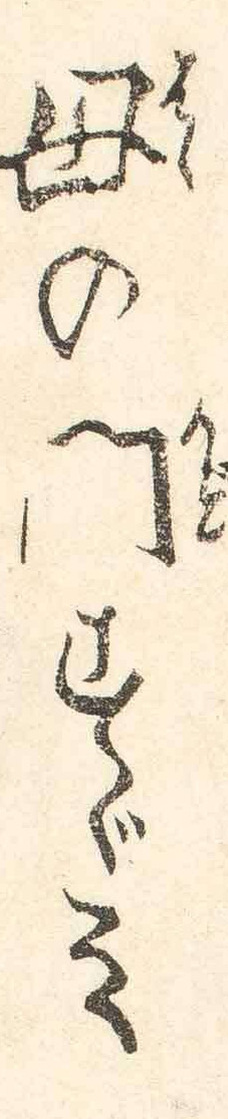母の門すゞみ
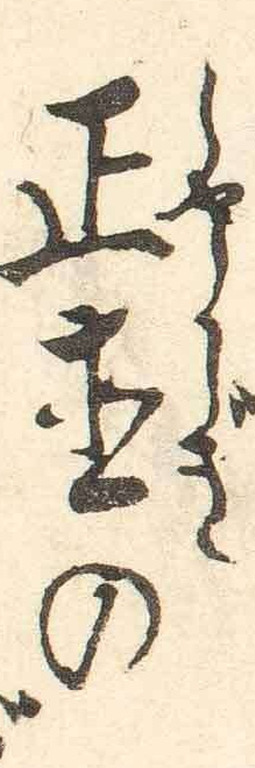正直の
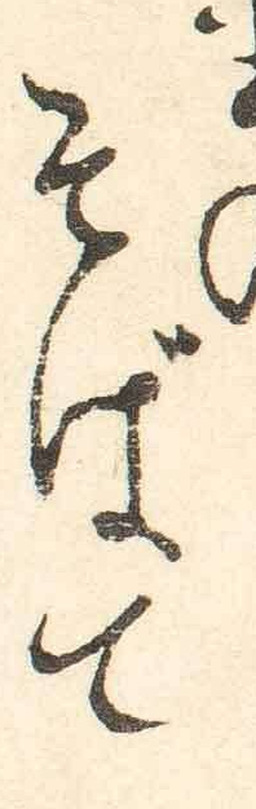そばて
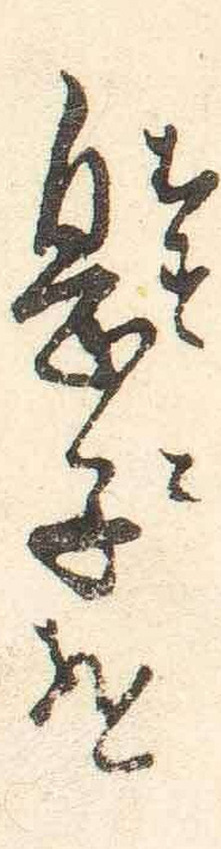息子を
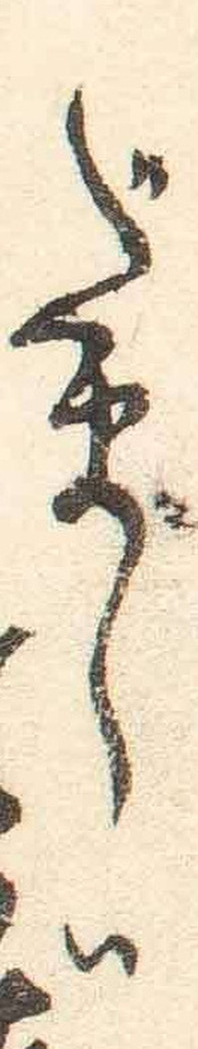だまし
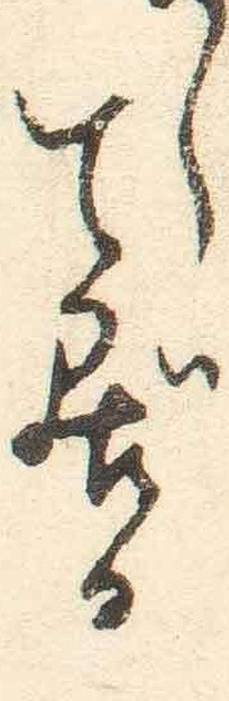て居る
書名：画本柳樽
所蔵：東京学芸大学附属図書館 国文学研究資料館
